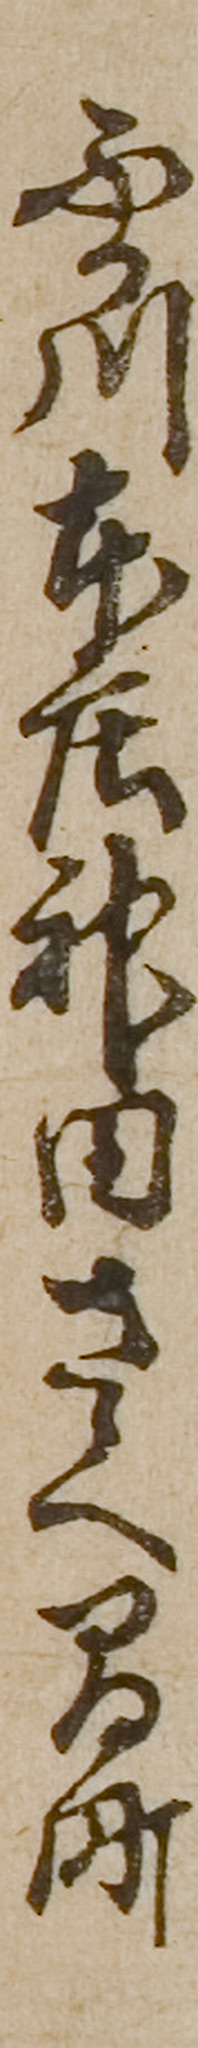ふか川本庄神田さく間町
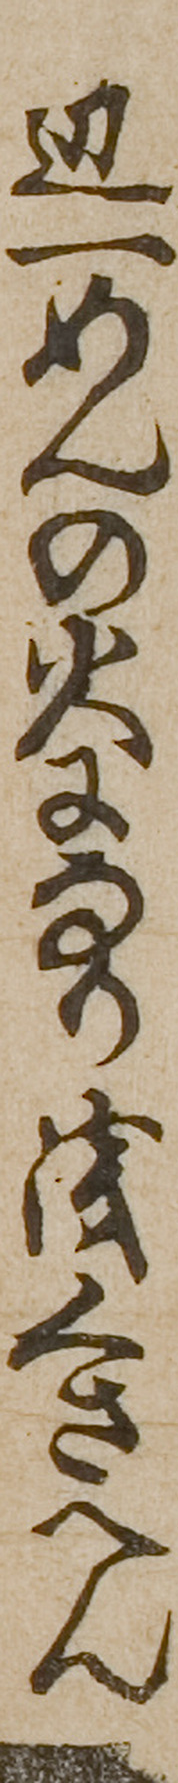辺一めんの火になり浅くさへん
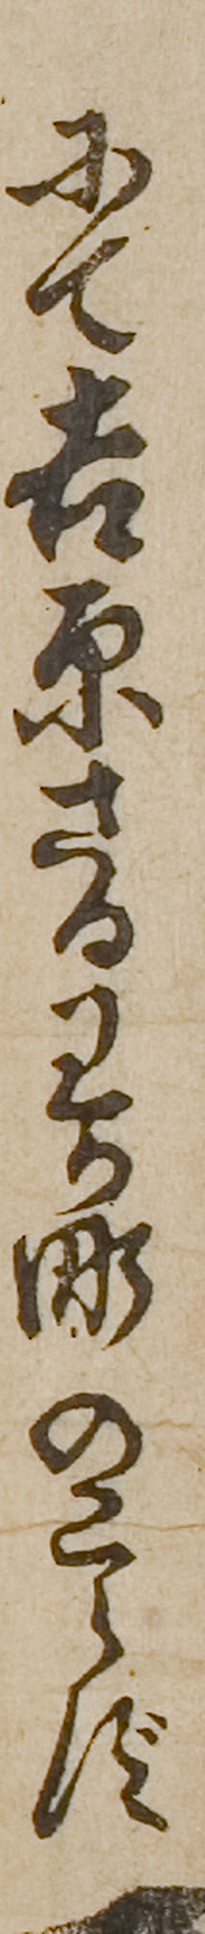にて吉原さるわか町のこらず
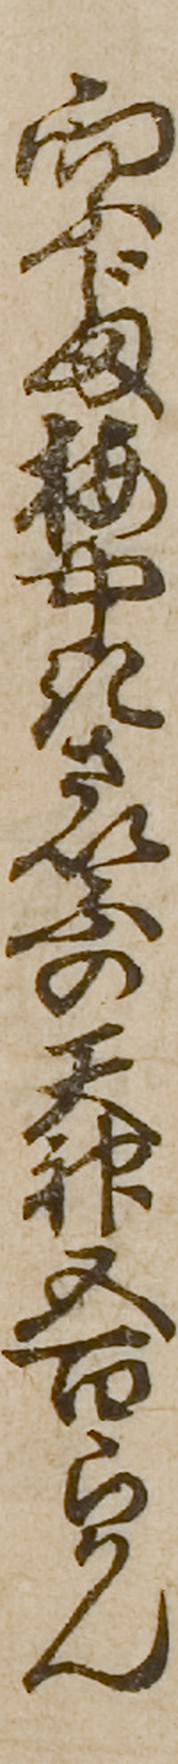向ふじま梅やしきさいふの天神五百らかん
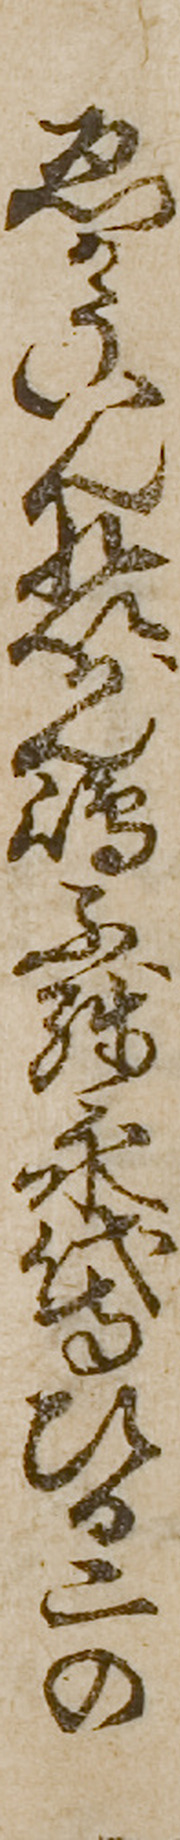ゑかういんれいかん嶋不残永代寺ひるこの
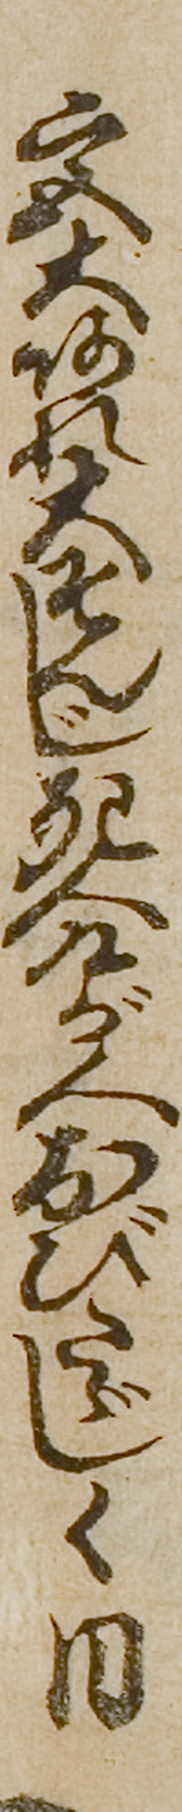宮大あれ大そんじ死人けが人おびたゞしく日
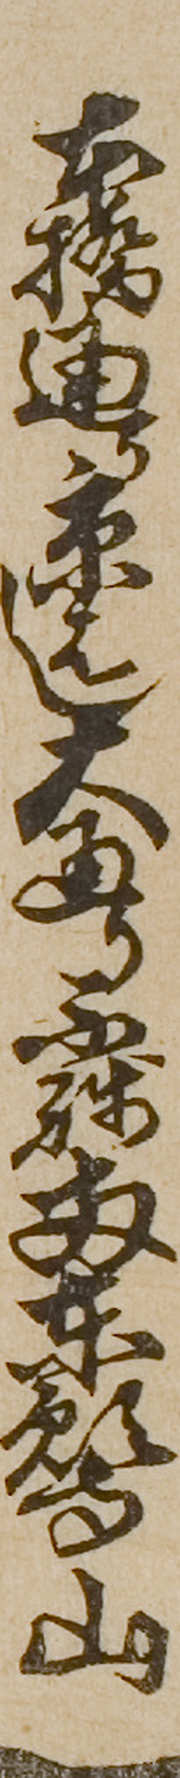本橋通り京はし大通り不残両本願寺山
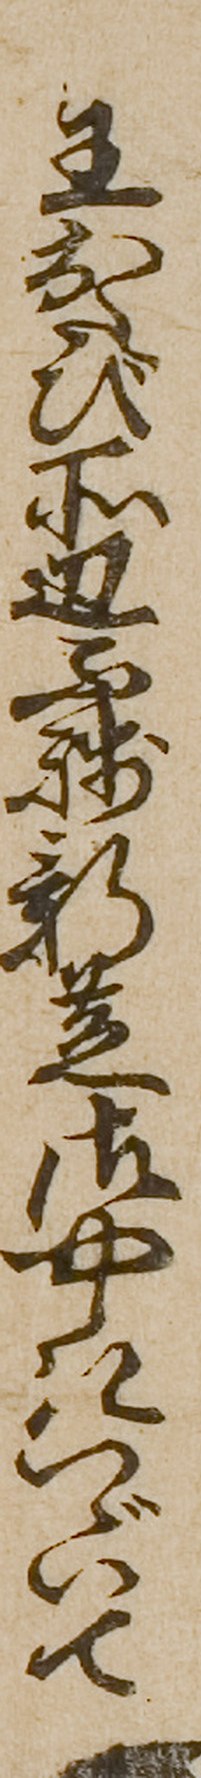王おたび所辺不残新芝御やしきつゞいて
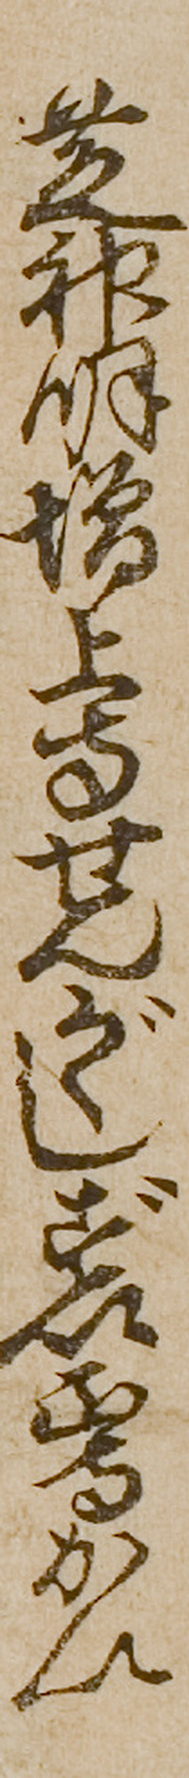芝神明増上寺せんがくじずい正寺かい
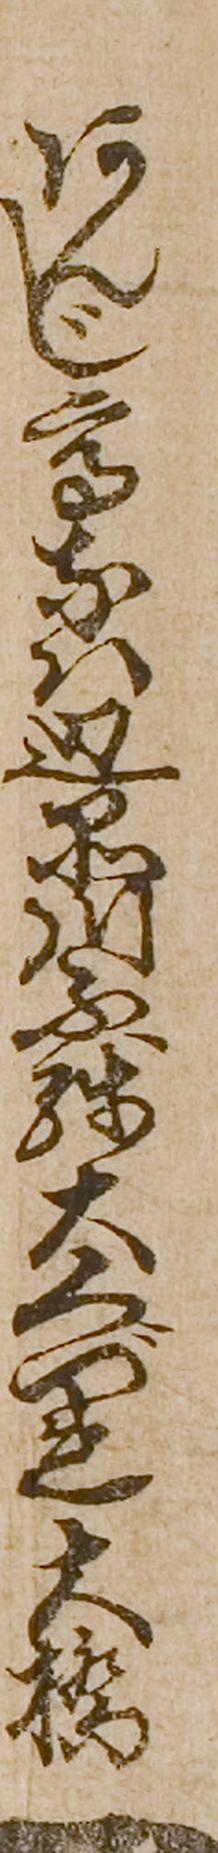あんじ高なは辺品川不残大くづれ大橋
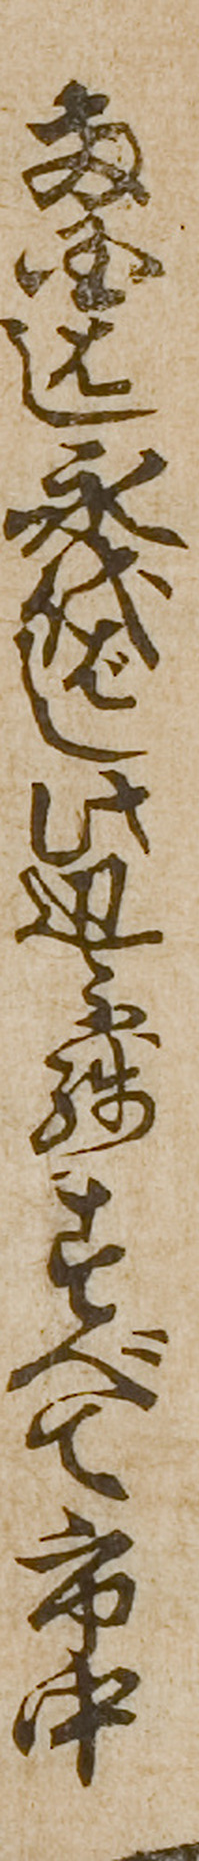両国はし永代ばし此辺不残すべて市中
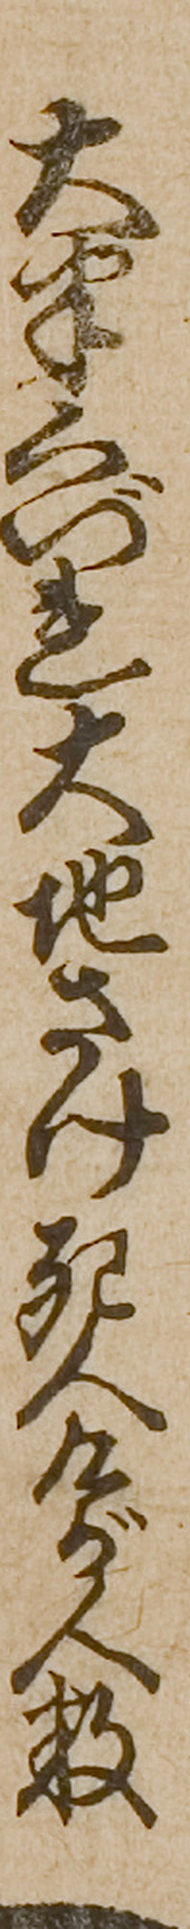大半くづれ大地さけ死人けが人数
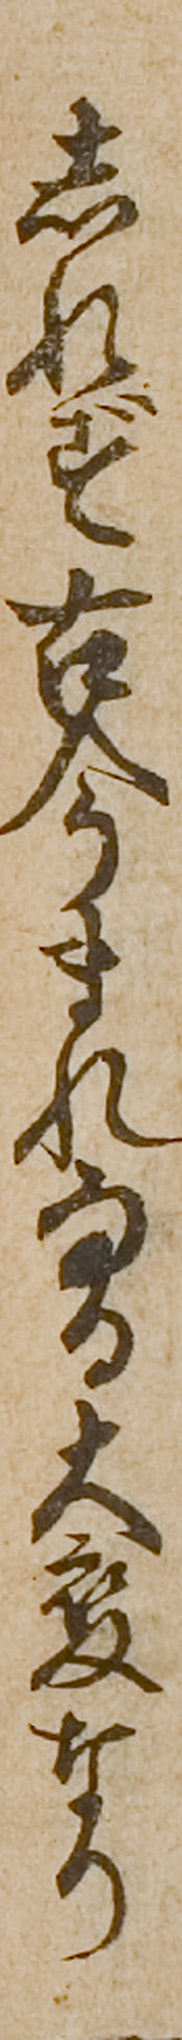しれず古今まれなる大変なり
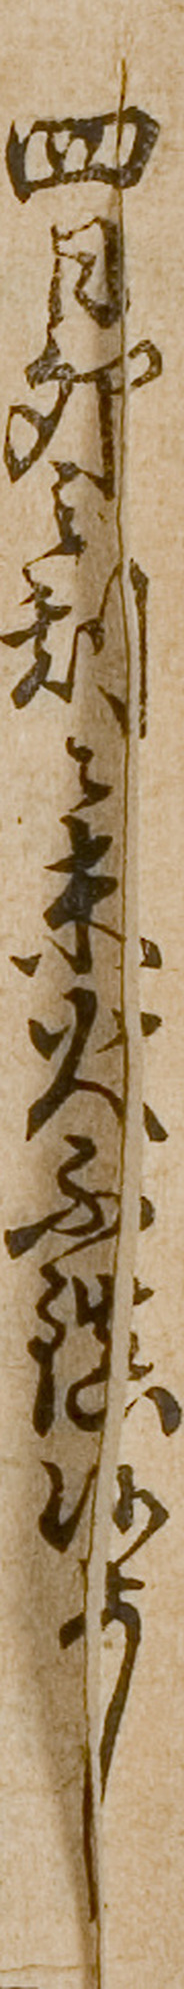四日卯之刻に未火不鎮候よし
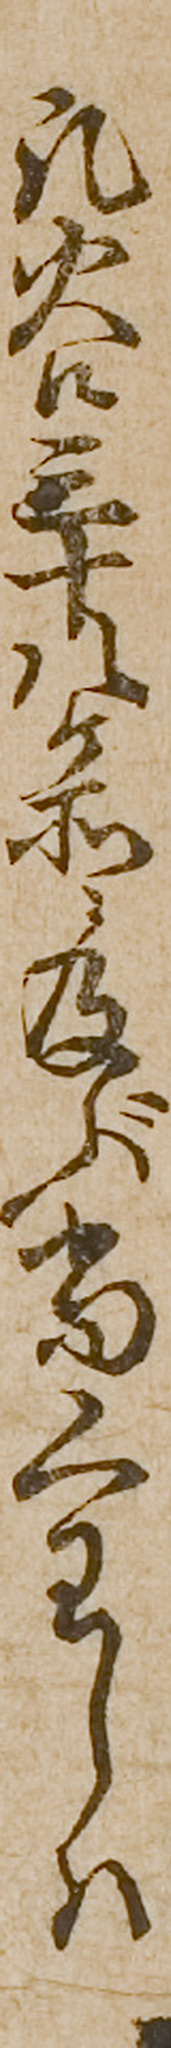凡火口三十八ヶ所に及ぶ尚くわしくは
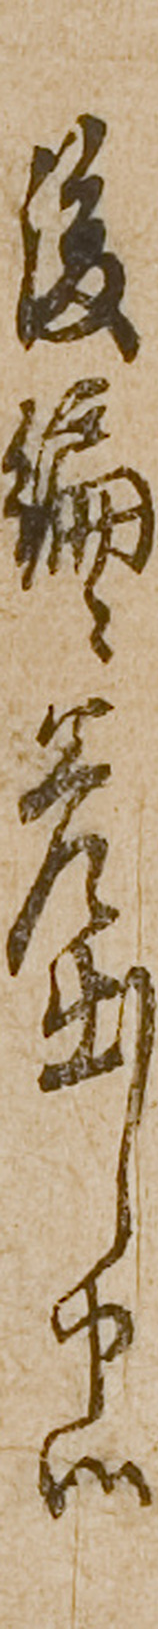後編に差出し申候
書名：震焼者附
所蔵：東京大学総合図書館 General Library in the University of Tokyo, JAPAN
